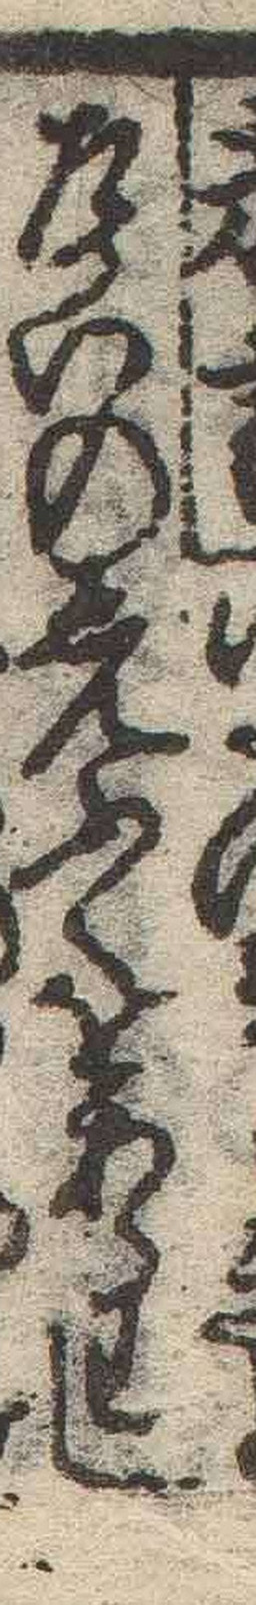たかいのしんふくをあらわし
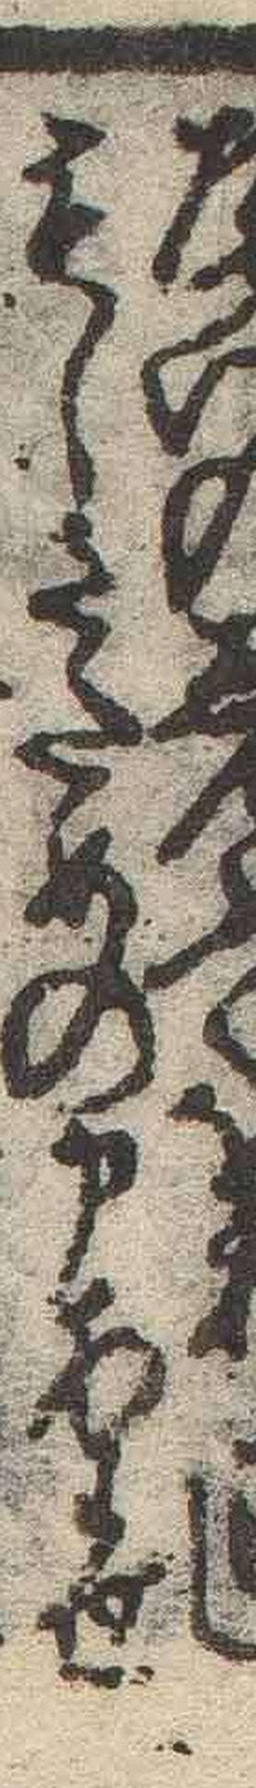もしさための申あわせ
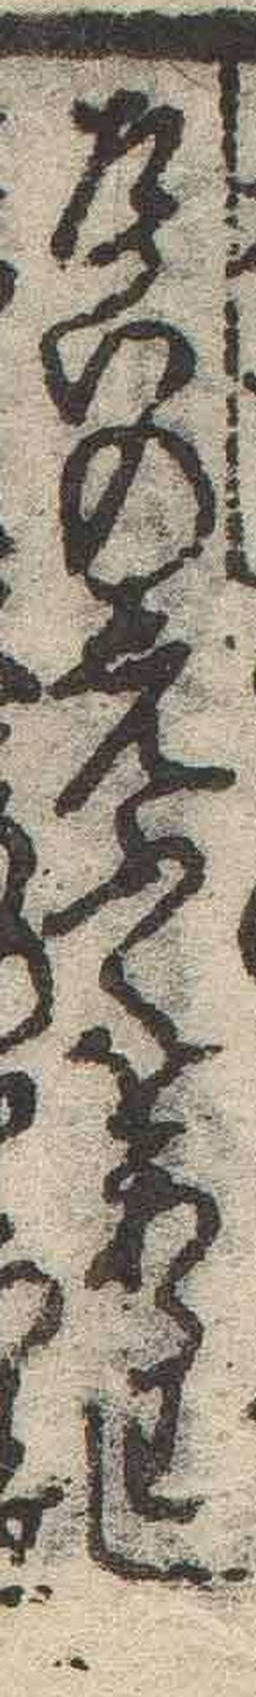たかいのしんふくをあらわし
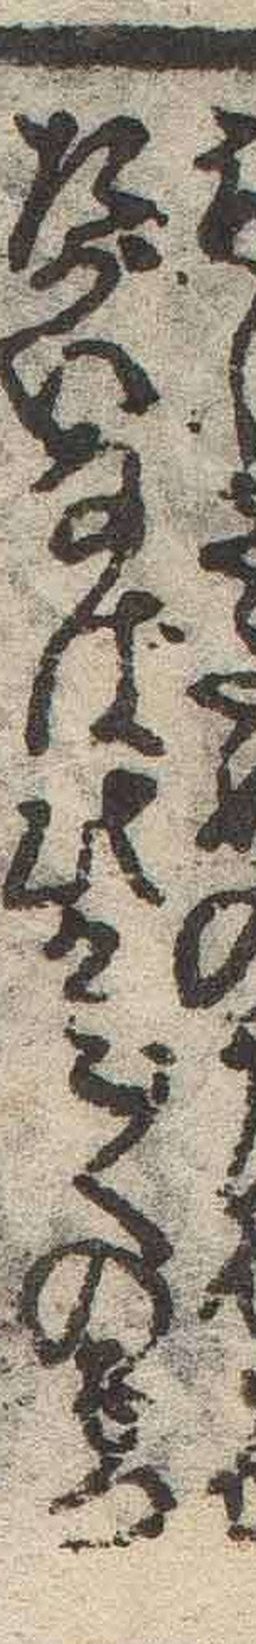たがいなば此かみ〳〵のはつ
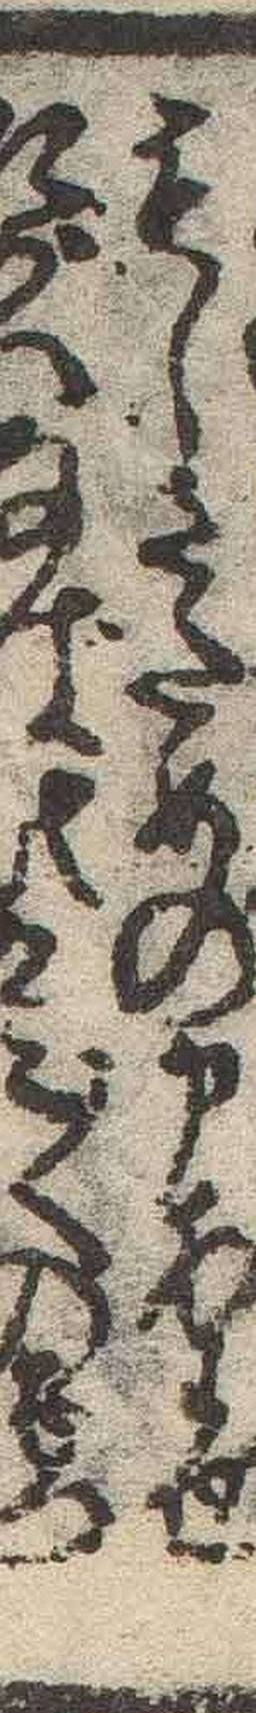たがいなば此かみ〳〵のはつ
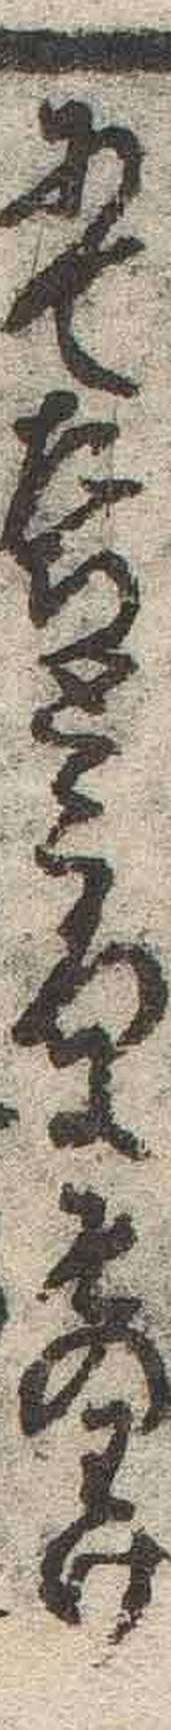にてたちところにそのわけ
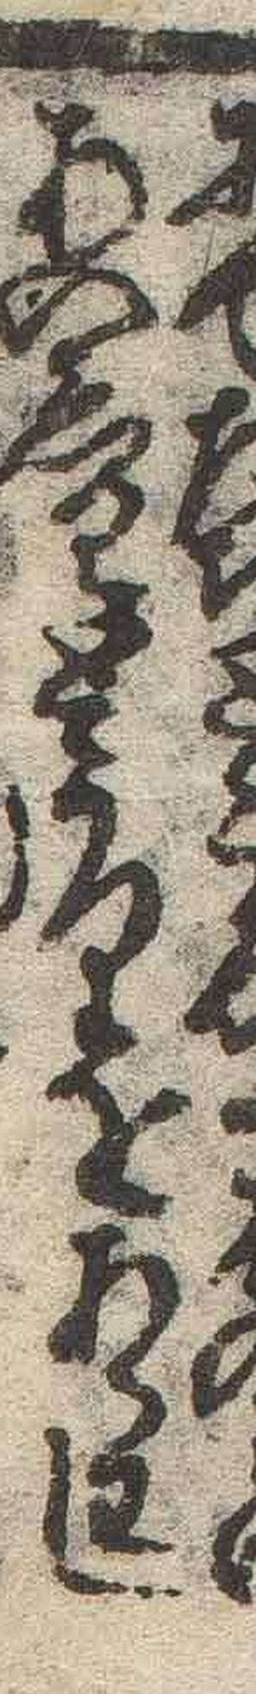あいしりとうりをあらわし
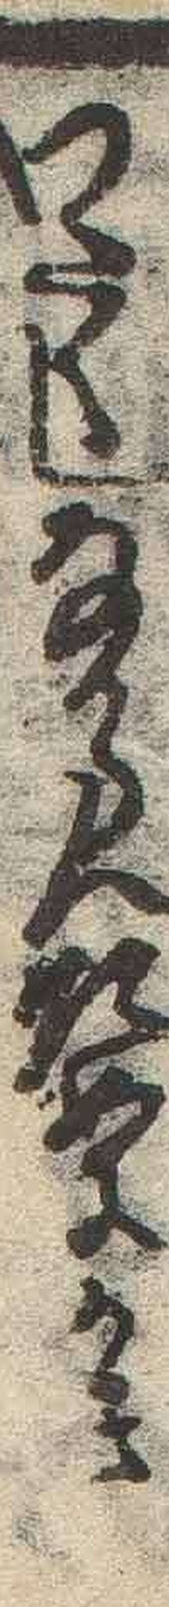わたくしなからんためにかき
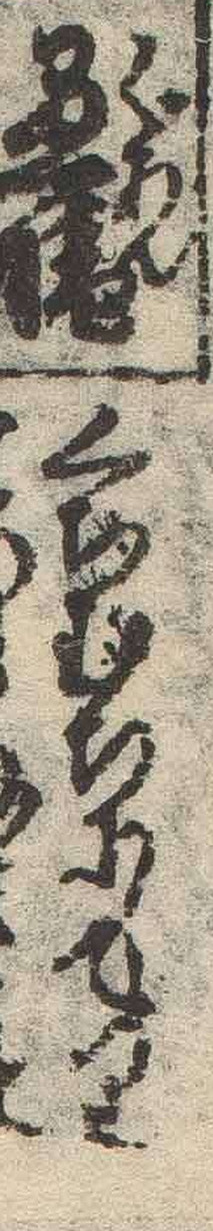愚暗くちむちにてり
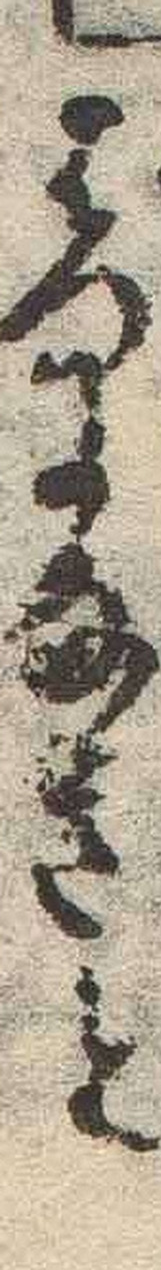はつになきこと
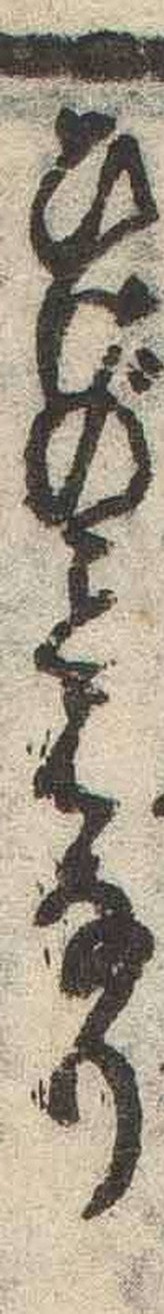ひげのことはなり
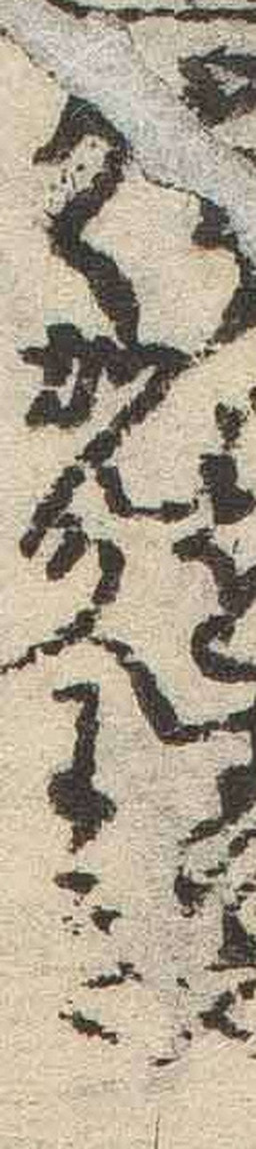よくかんかへわき
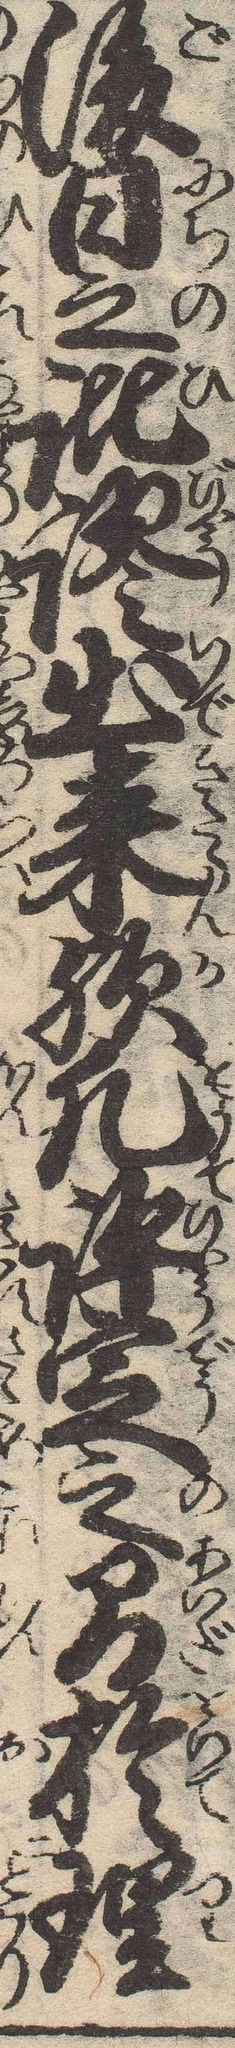後日之誹繆出来欤凡評定之間於理
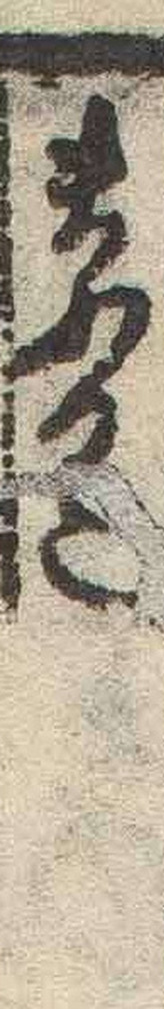まふる也
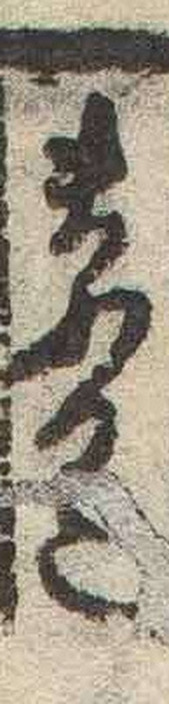まふる也
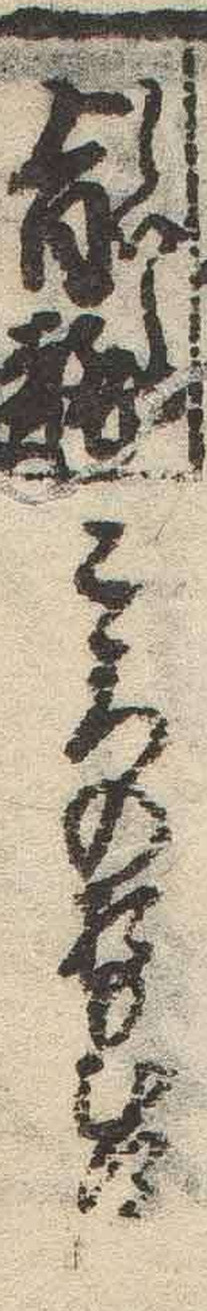旨趣こころのおもむき
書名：御成敗式目絵抄
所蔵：東京学芸大学附属図書館 国文学研究資料館
